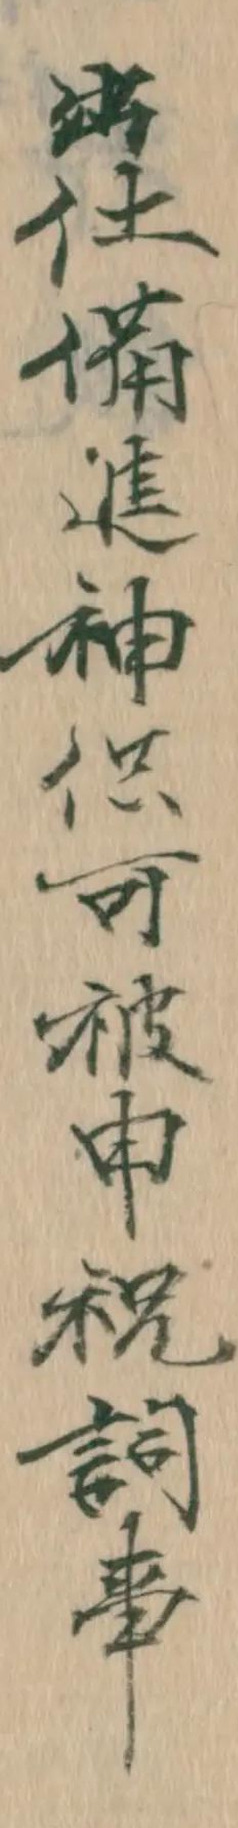出仕備進神供可被申祝詞事
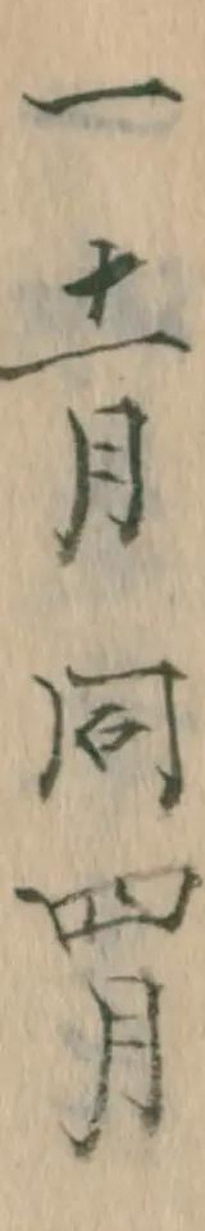一十一月同四月
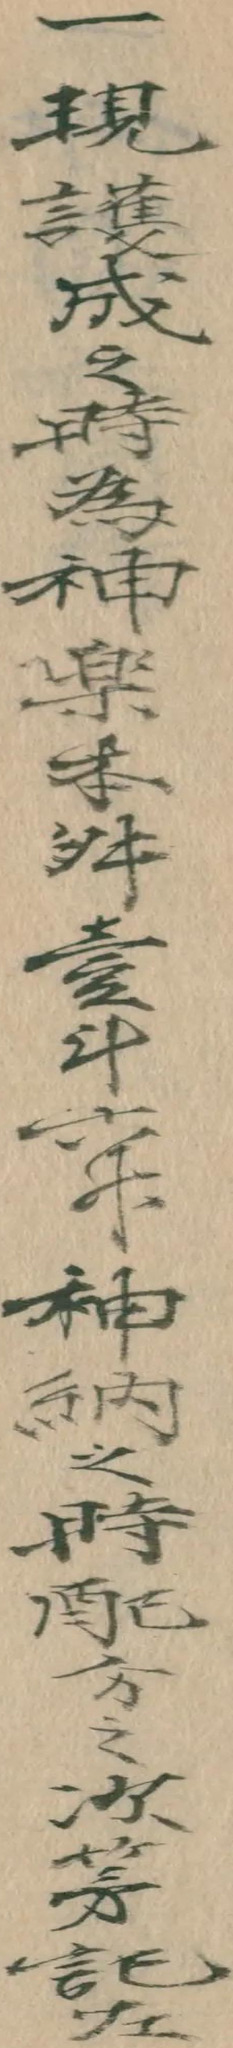一現護成之時為神楽本舛壱斗六升神納之時配分之次第記左
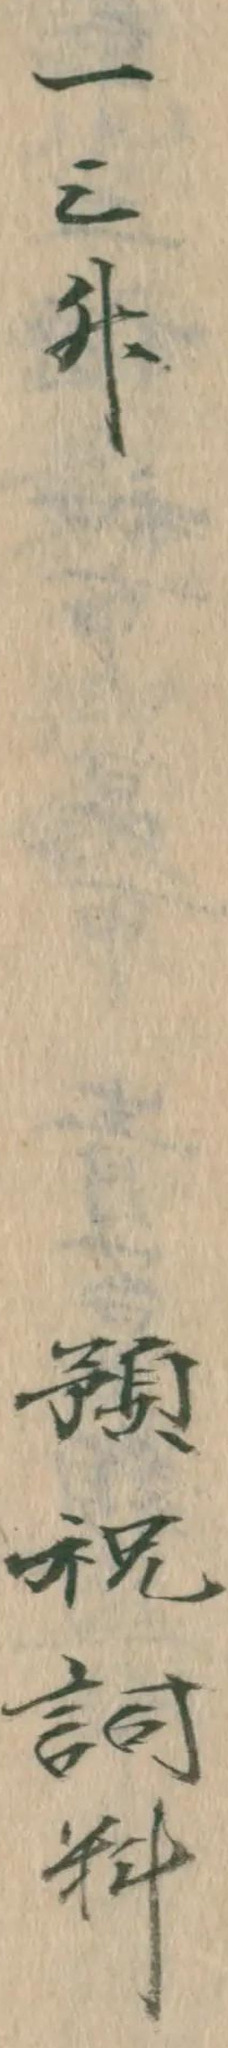一三升預祝詞料
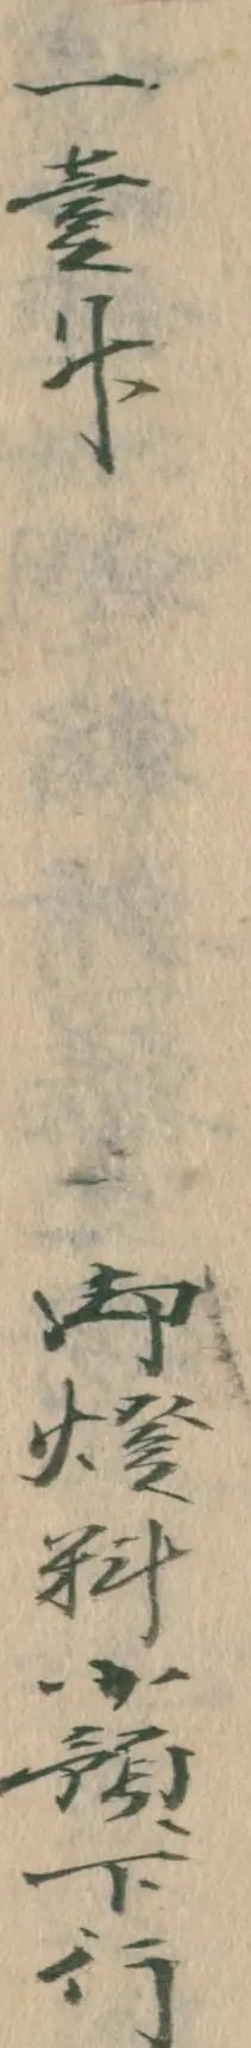一壱升御燈料小預下行
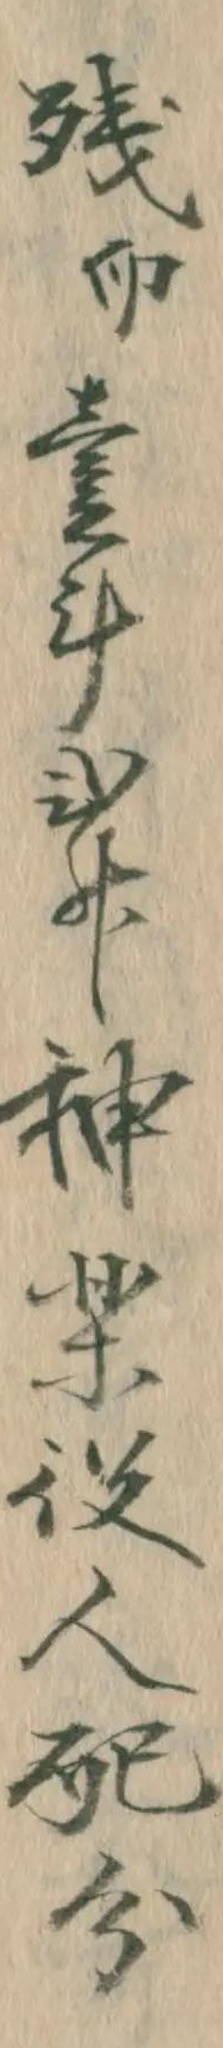残而壱斗弐升神楽役人配分
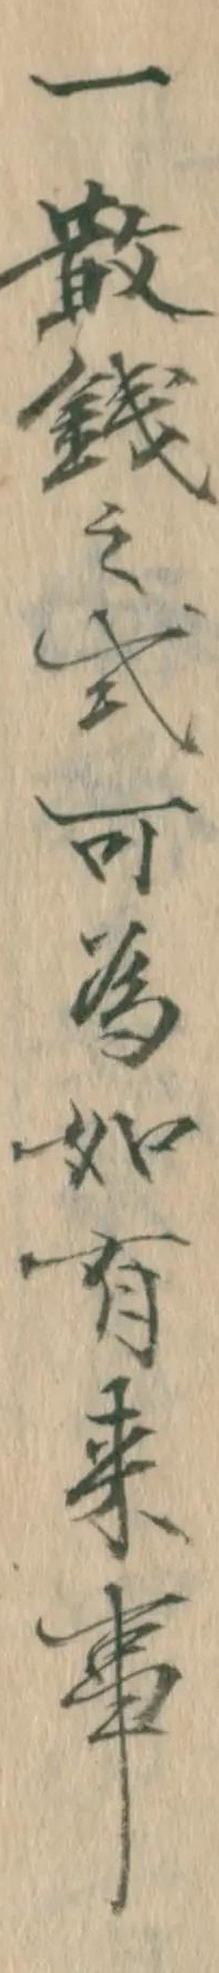一散銭之式可為如有来事
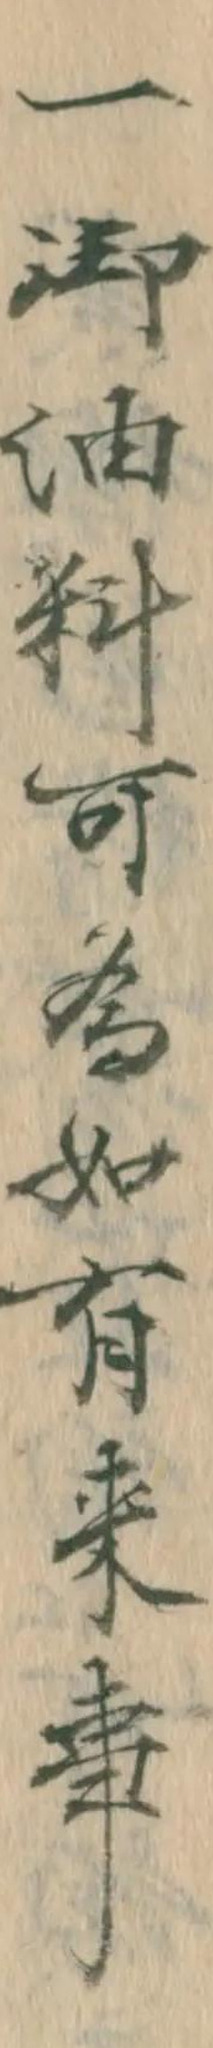一御油料可為如有来事
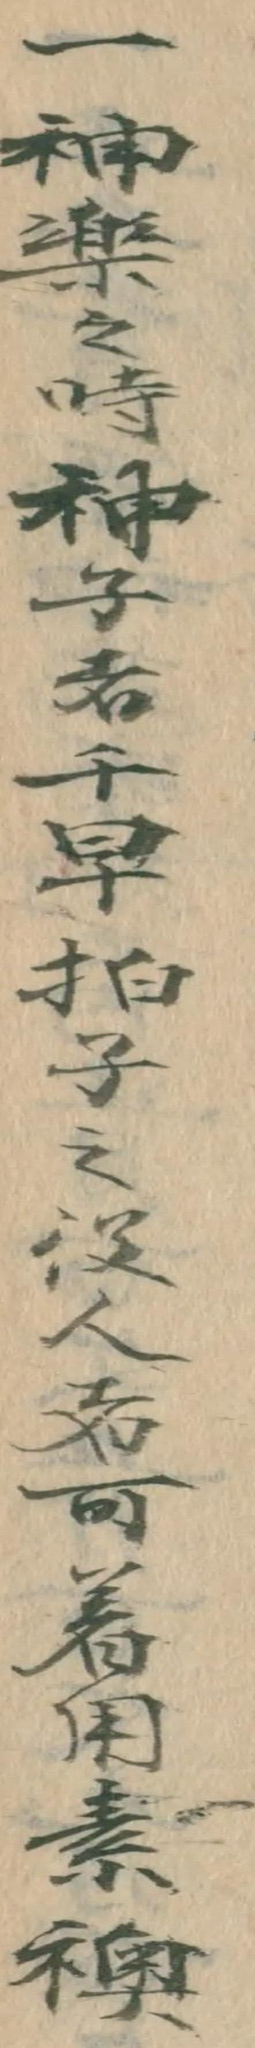一神楽之時神子者千早拍子之役人者可着用素襖

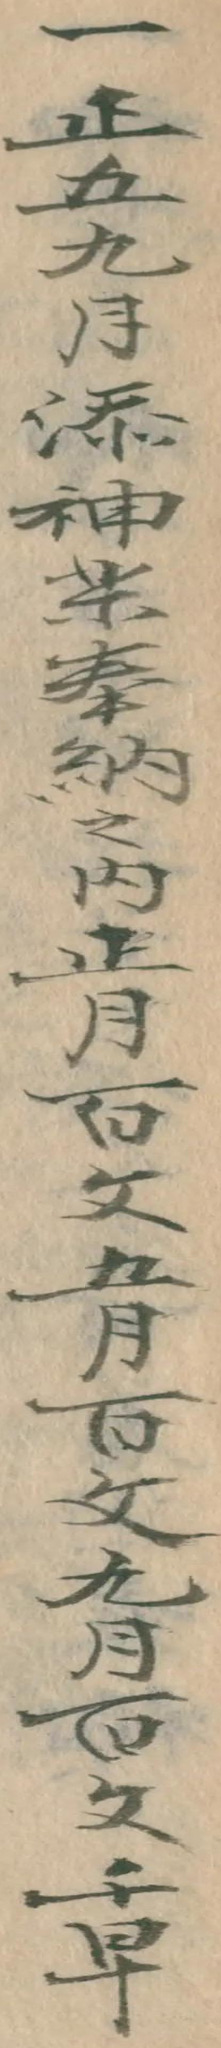一正五九月添神楽奉納之内正月百文五月百文九月百文千早
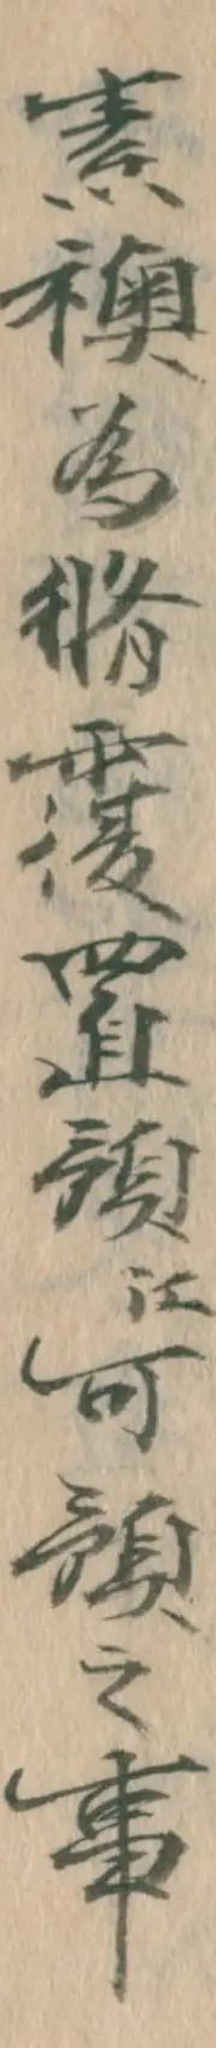素襖為脩覆置預江可預之事
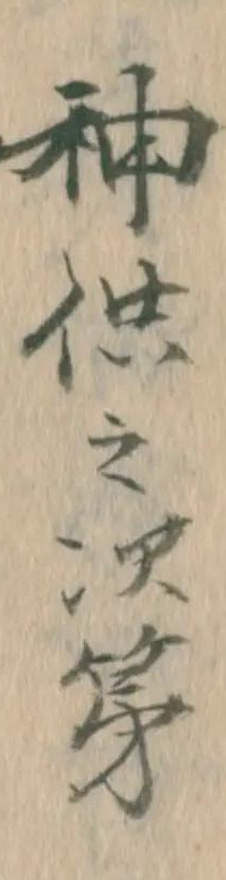神供之次第
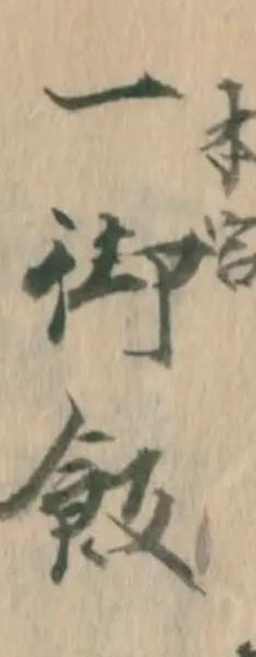一御飯
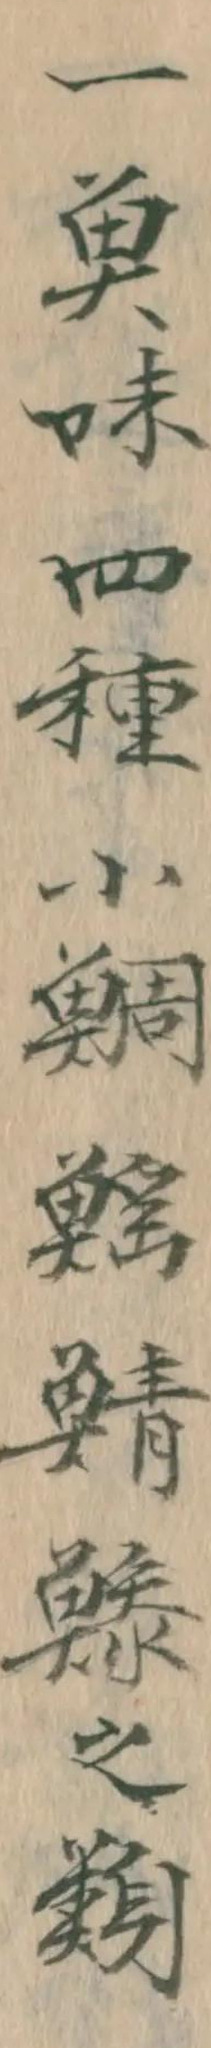一魚味四種小鯛鰩鯖鯵之類
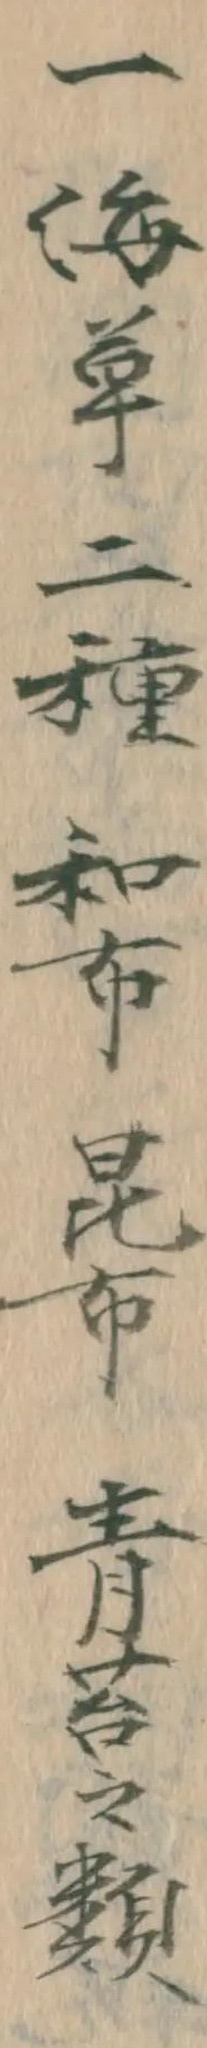一海草二種和布昆布青苔之類
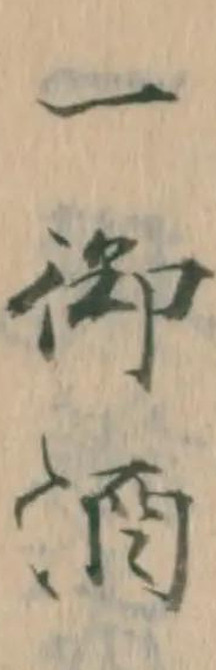一御酒
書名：賀茂社記録. 第9冊
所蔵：国立国会図書館 National Diet Library, JAPAN
